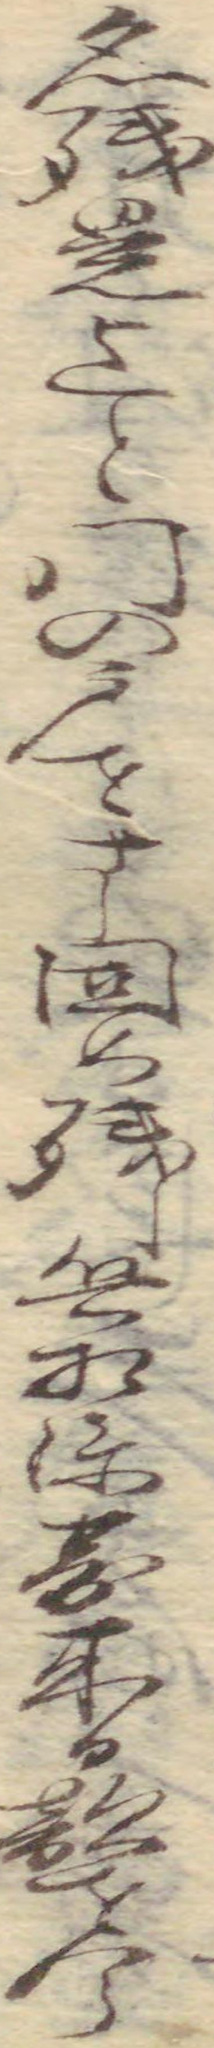名残是迄と門の戸をさし固め残し兵相添寄来る敵を今
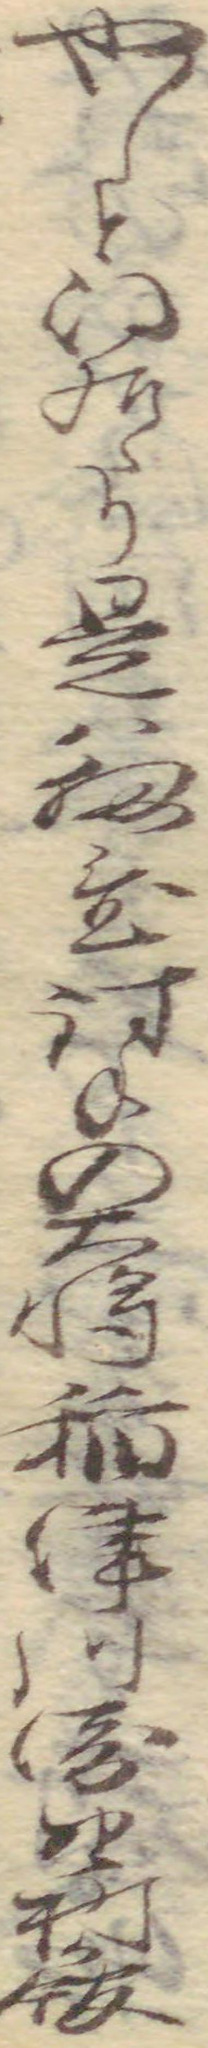や〳〵と待居たり是は扨置討手の大将稲津川崎野村か館
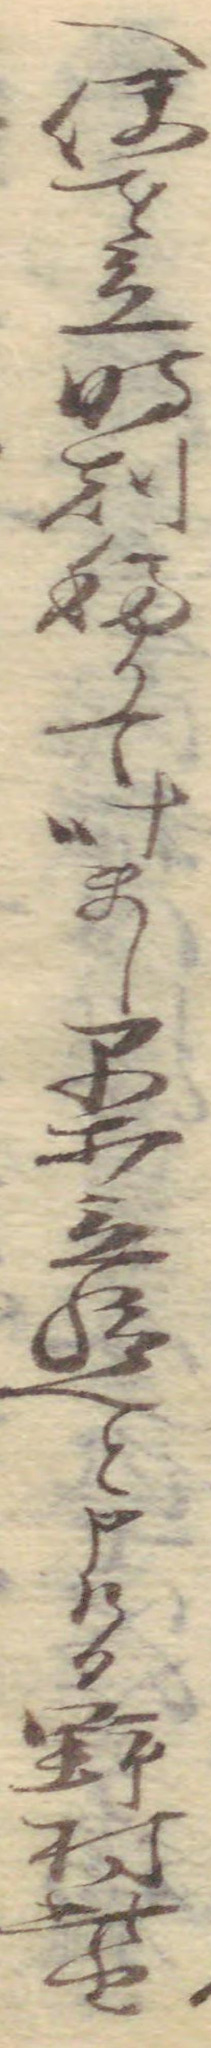へ使を立時刻移りて叶まし早打立給へと申ける野村此由
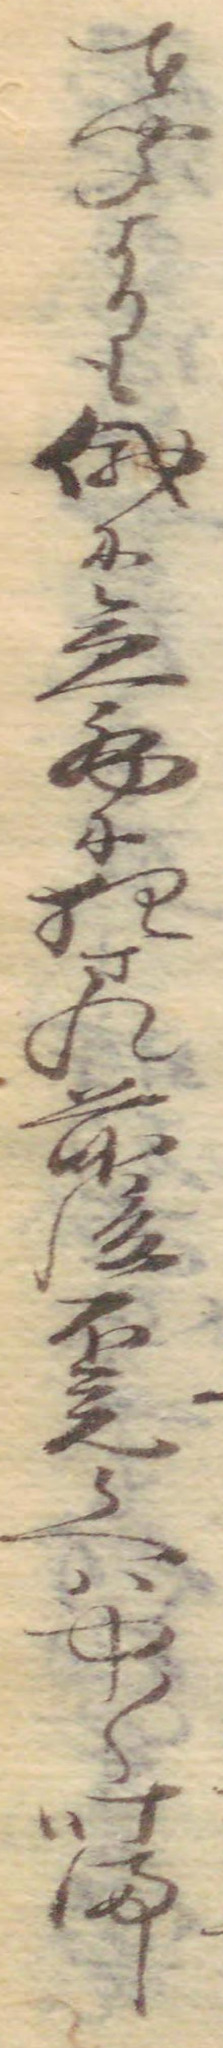を聞よりも俄に急病に犯され前後不覚候へは中々叶まし

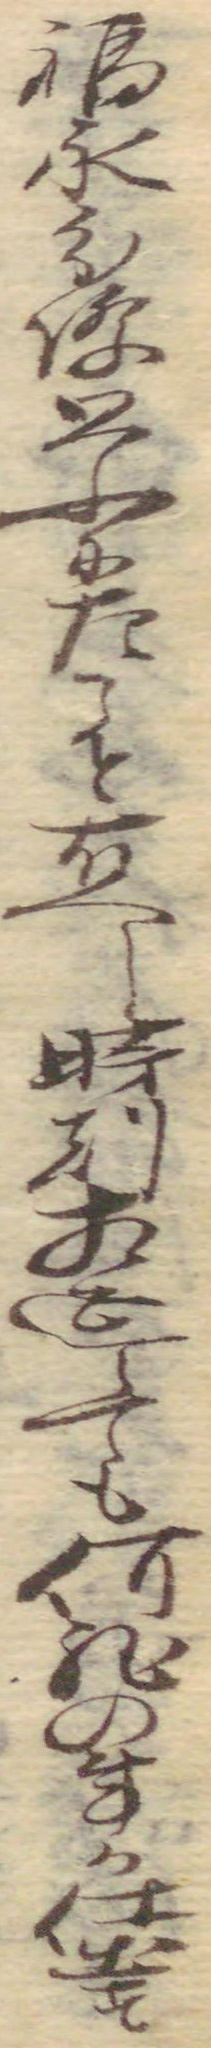福永分際思ふに左こそ有へし時刻相延しても何程の事か仕出す
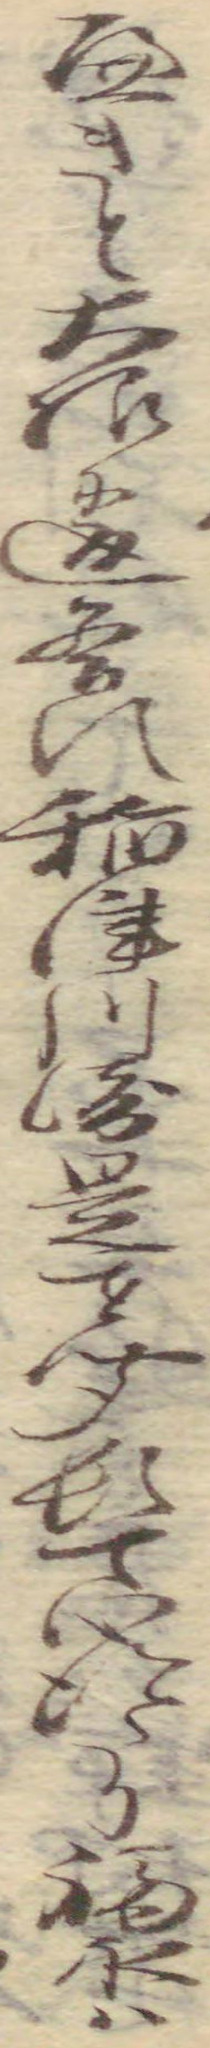へきと大様に返答す稲津川崎是を聞頓て心得たり福永は
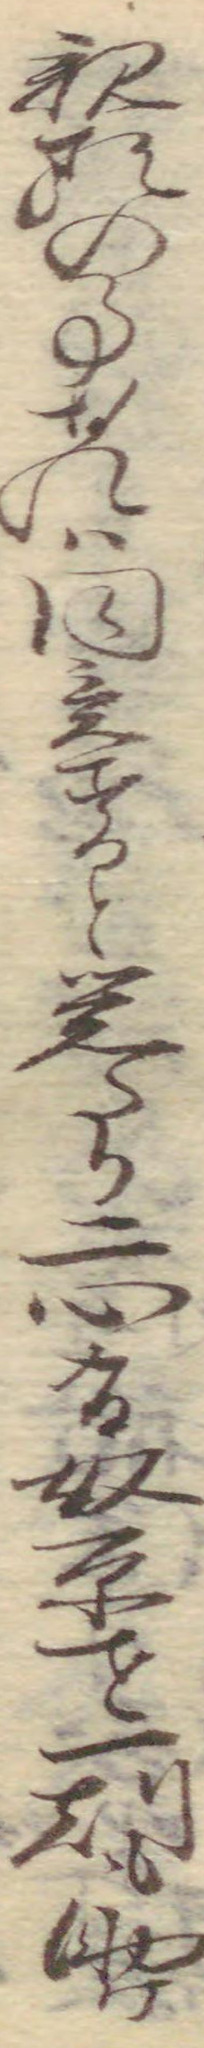親類の事なれは同意すると覚たり二心有奴原を一刻も助け
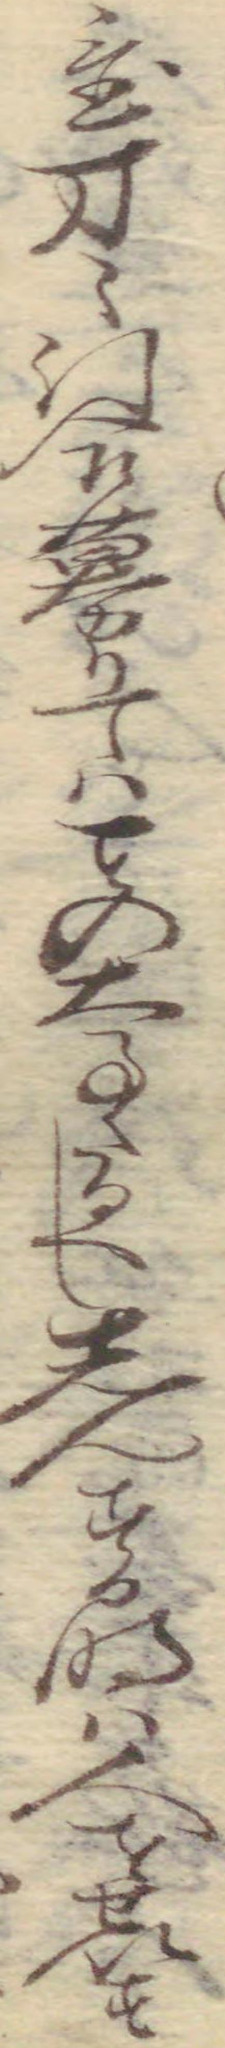置方々引合募りてはことの大事たるへし先んする時は人をせいす
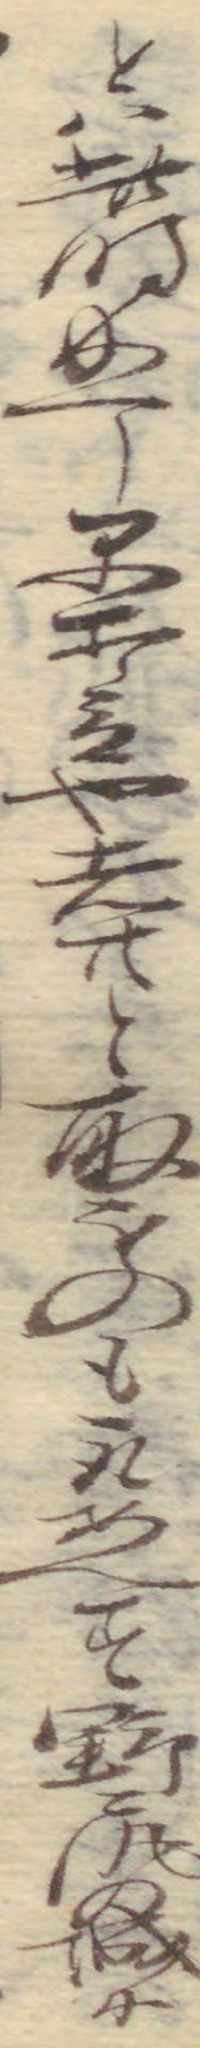とは此時成へし早打立や者共と取ものも取あへす野尻の城に
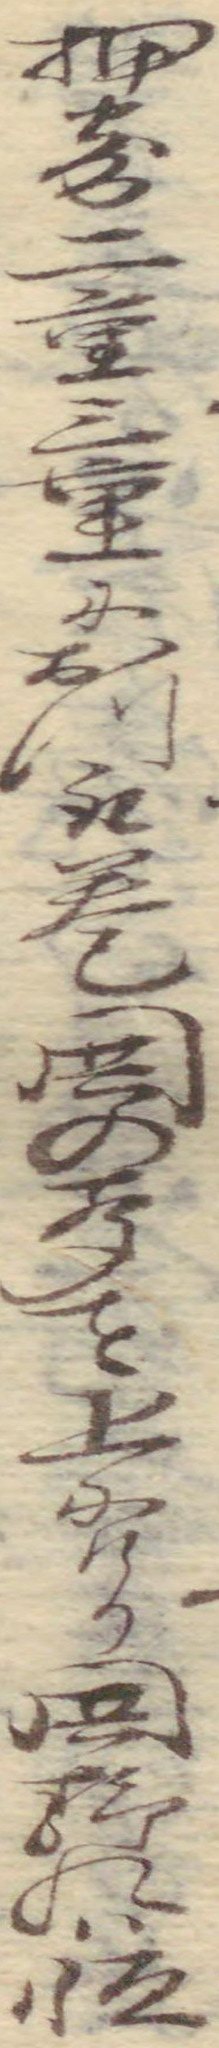押寄二重三重におつ取巻鬨の声上にけり鬨静れは恒
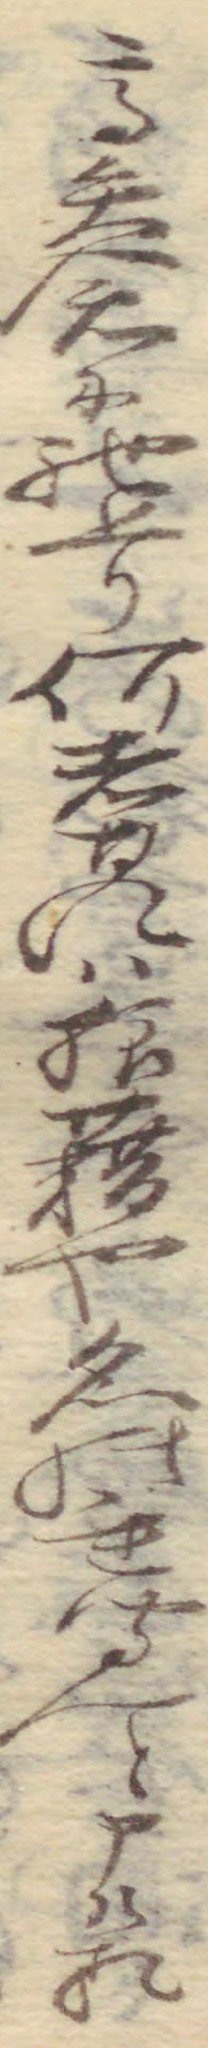高矢倉に馳上り何者なれは狼藉や名のれ聞んと申ける
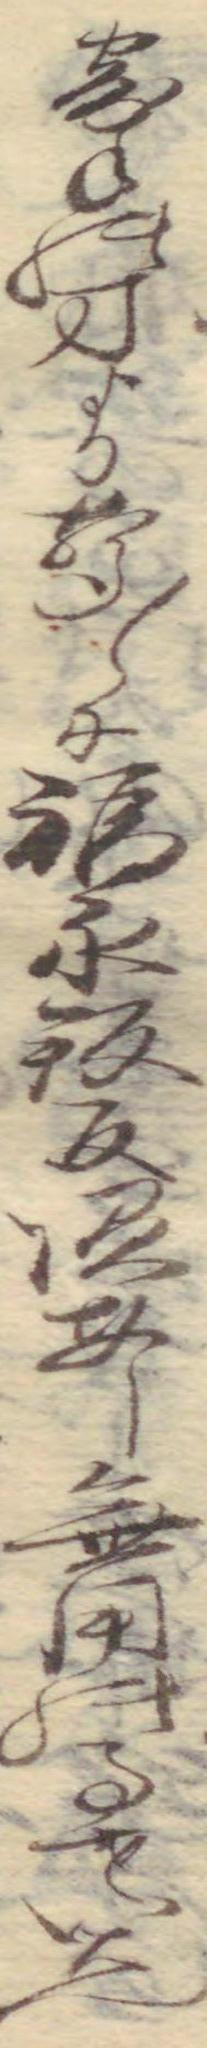寄手の方より声々に福永叛反隠なし無用の事をいはん
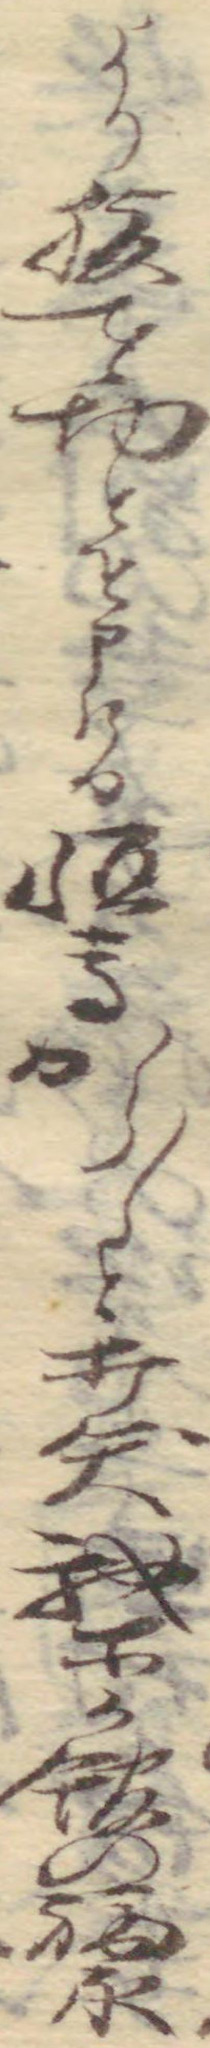より腹を切とそ申ける恒高から〳〵と打笑我等か館の福永
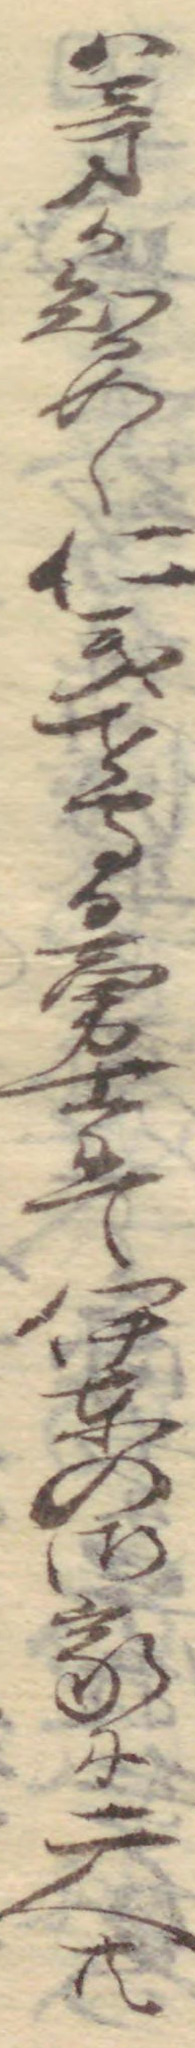は旁か知る如く仁義を守る勇士にて伊東の御家に二人共
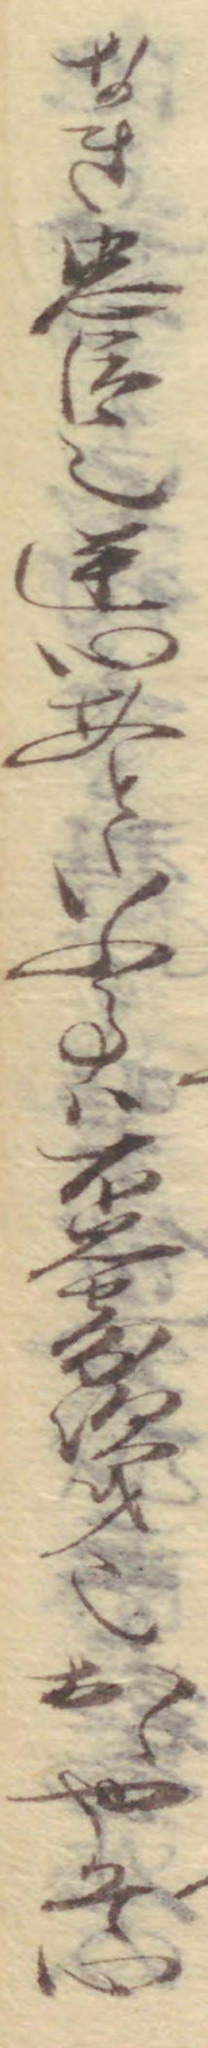なき忠臣也逆心なとゝいふ事は不思寄次第也おゝやかて心
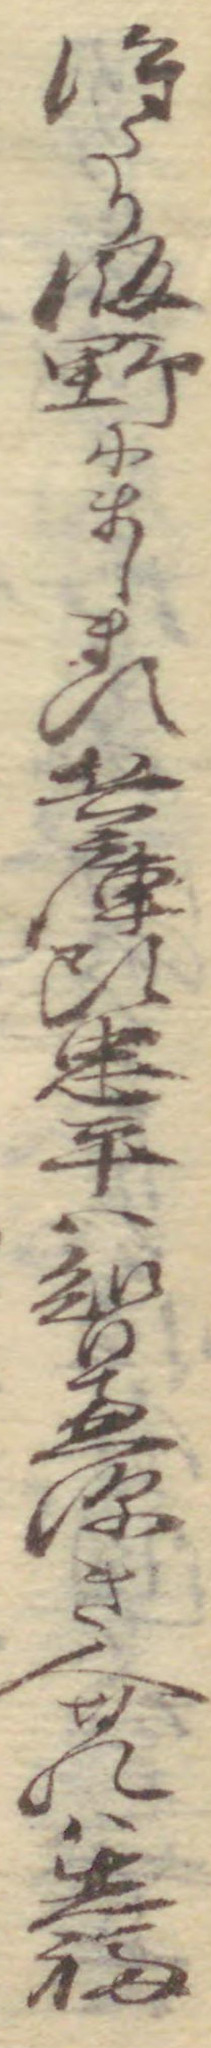得たり飯野にまします兵庫頭忠平は智恵深き人なれは先福
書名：鶯宿雑記. 巻199-200
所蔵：国立国会図書館 National Diet Library, JAPAN
